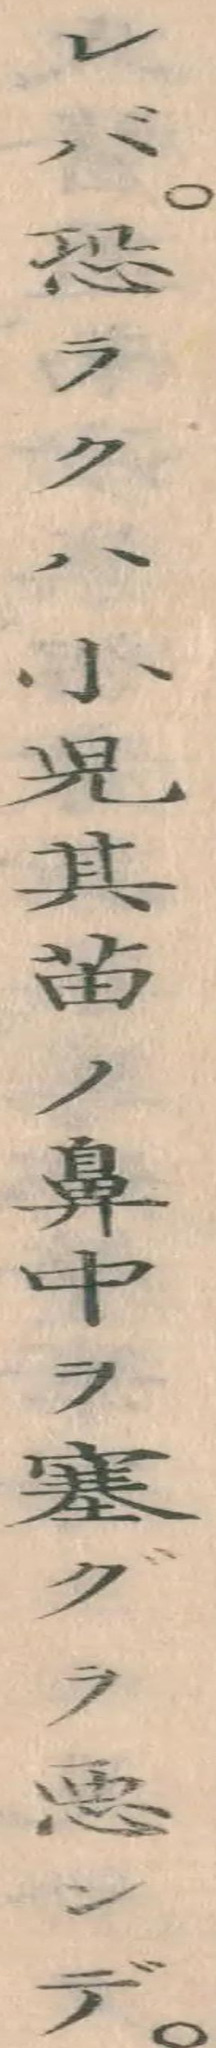レバ。恐ラクハ小児其苗ノ鼻中ヲ塞グヲ悪ンデ。
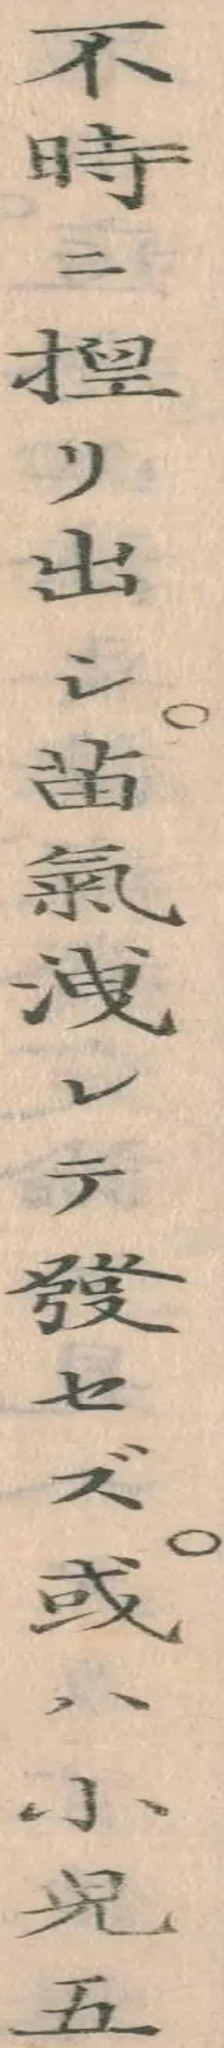不時ニ捏リ出シ。苗気洩レテ発セズ。或ハ小児五
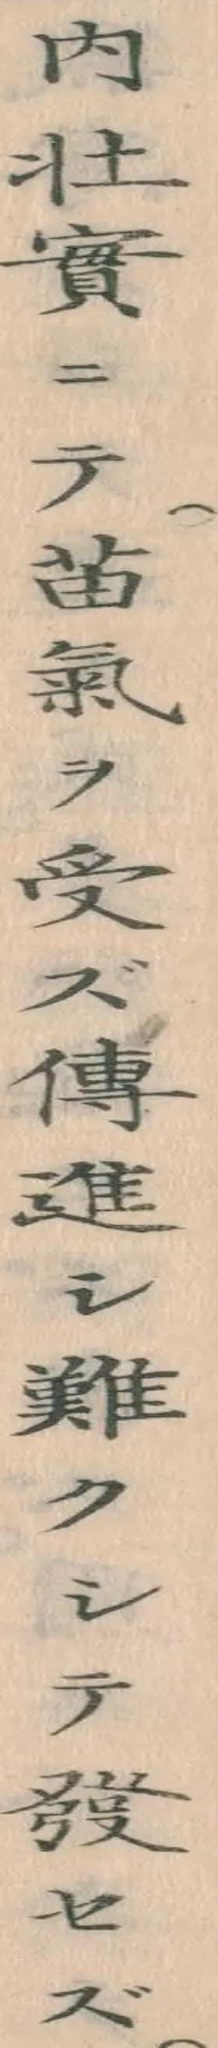内壮実ニテ。苗気ヲ受ズ伝進シ難クシテ発セズ。
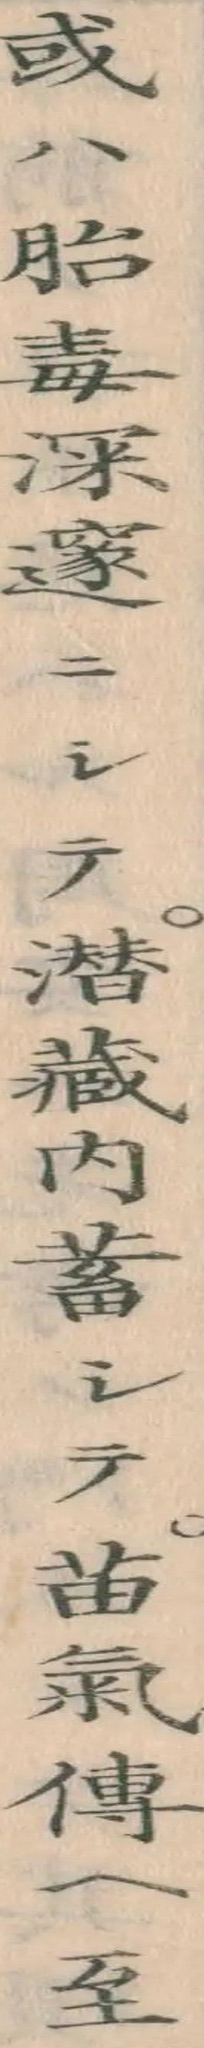或ハ胎毒深邃ニシテ。潜蔵内蓄シテ。苗気伝ヘ至
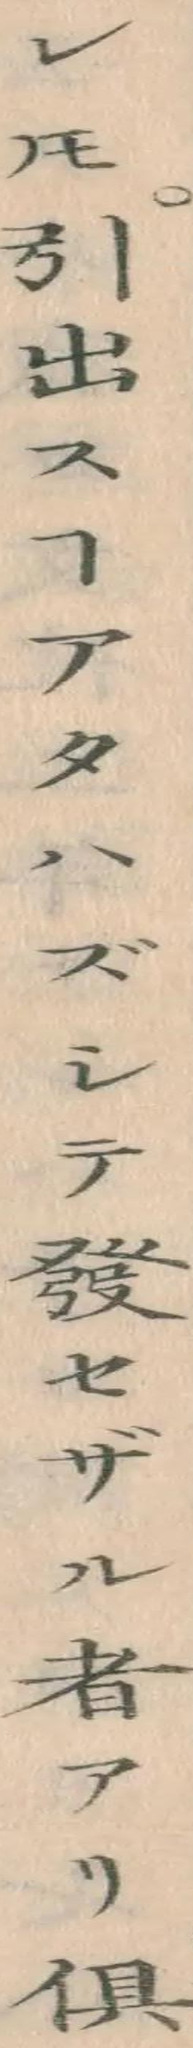レ𪜈。引出スヿアタハズシテ発セザル者アリ。倶
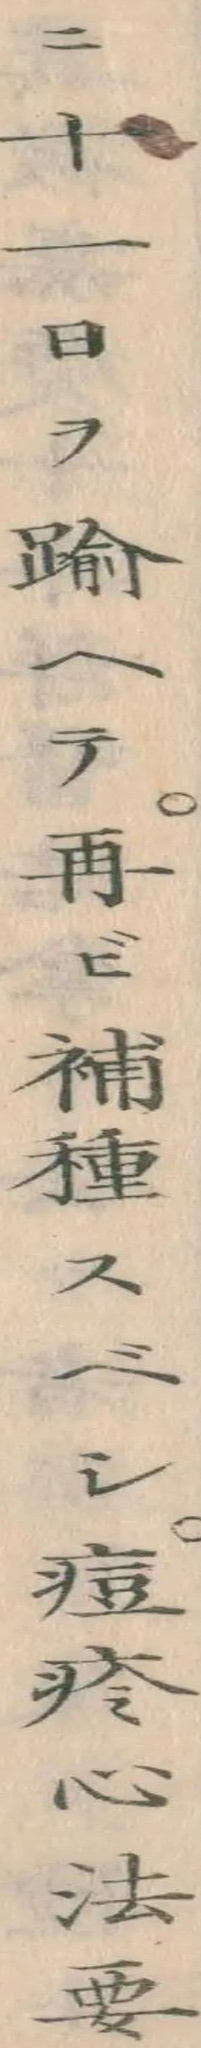ニ十一日ヲ踰ヘテ。再ビ補種スベシ。痘疹心法要
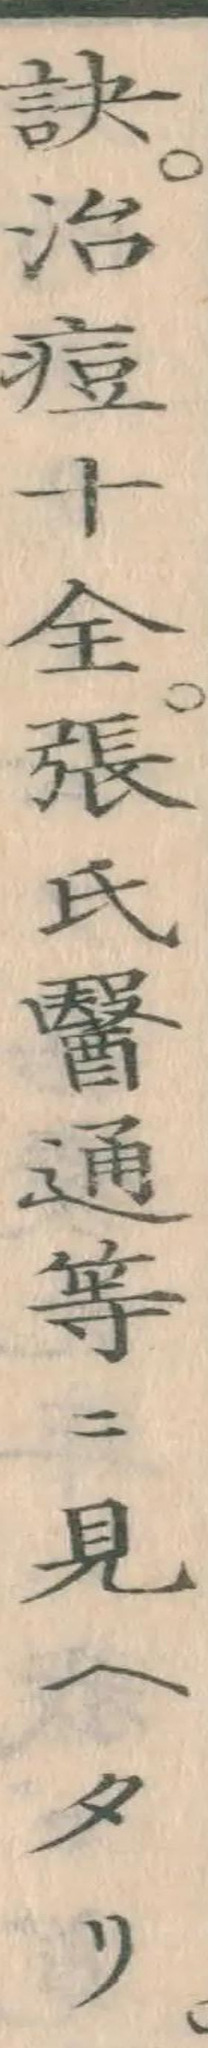訣。治痘十全。張氏医通等ニ見ヘタリ。
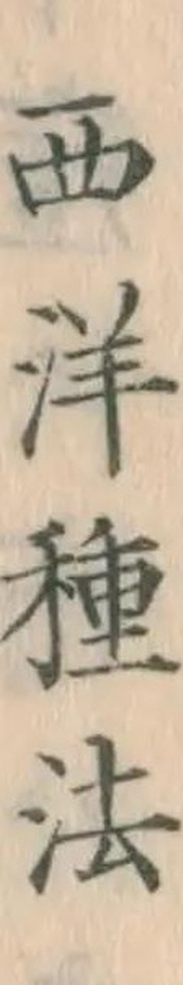西洋種法
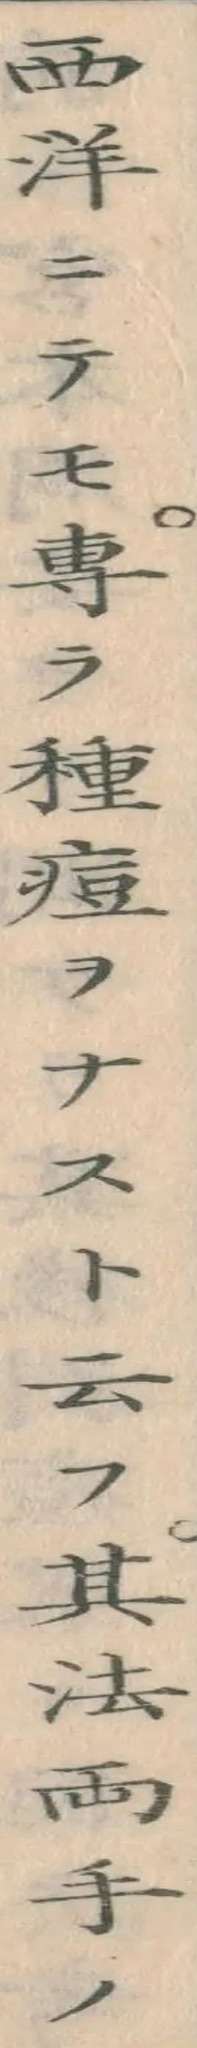西洋ニテモ。専ラ種痘ヲナスト云フ。其法両手ノ
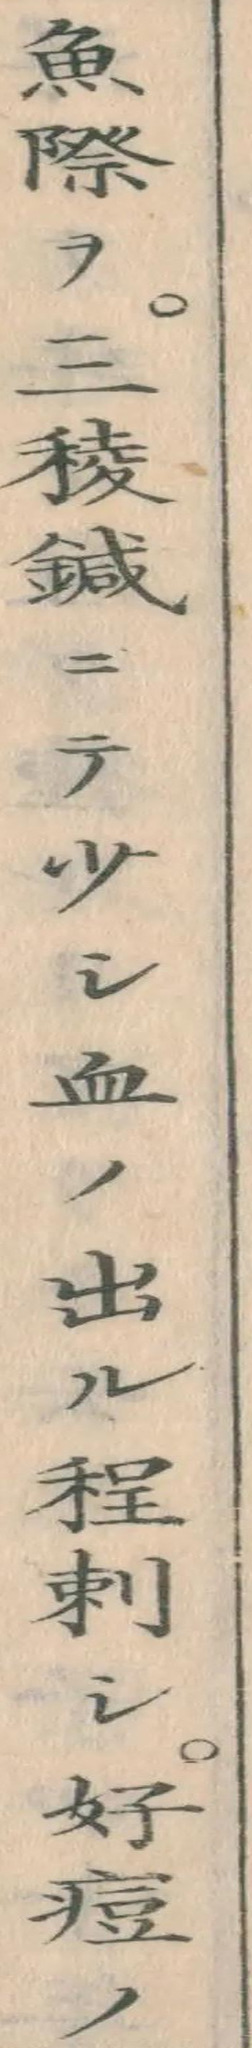魚際ヲ。三稜鍼ニテ少シ血ノ出ル程刺シ。好痘ノ
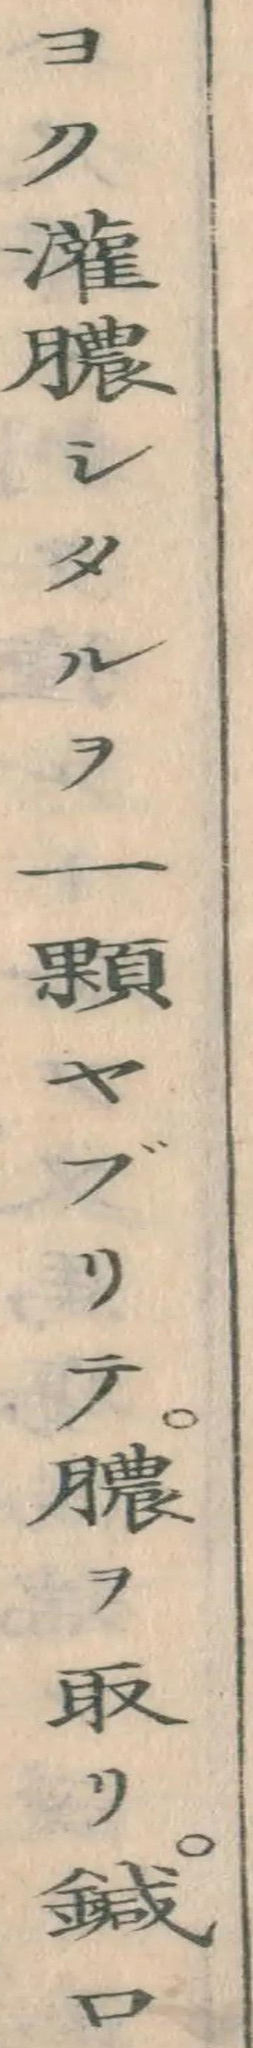ヨク灌膿シタルヲ一顆ヤブリテ。膿ヲ取リ。鍼口
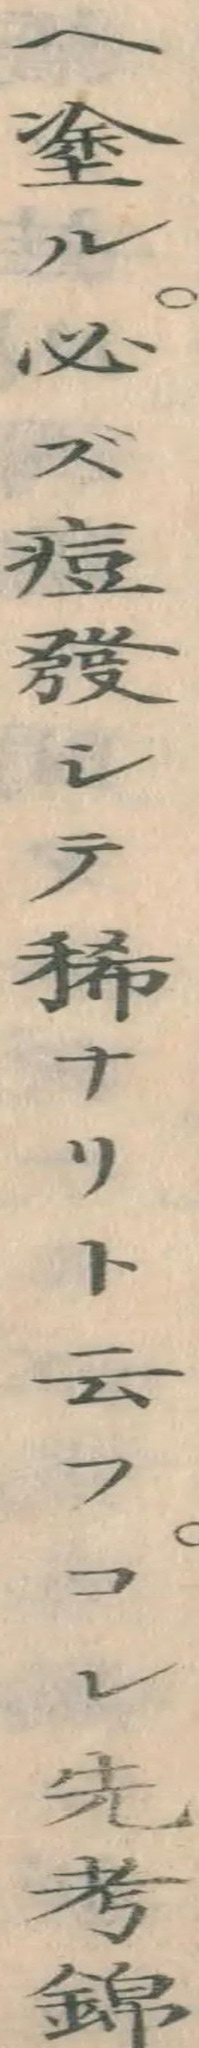ヘ塗ル。必ズ痘発シテ稀ナリト云フ。コレ先考錦

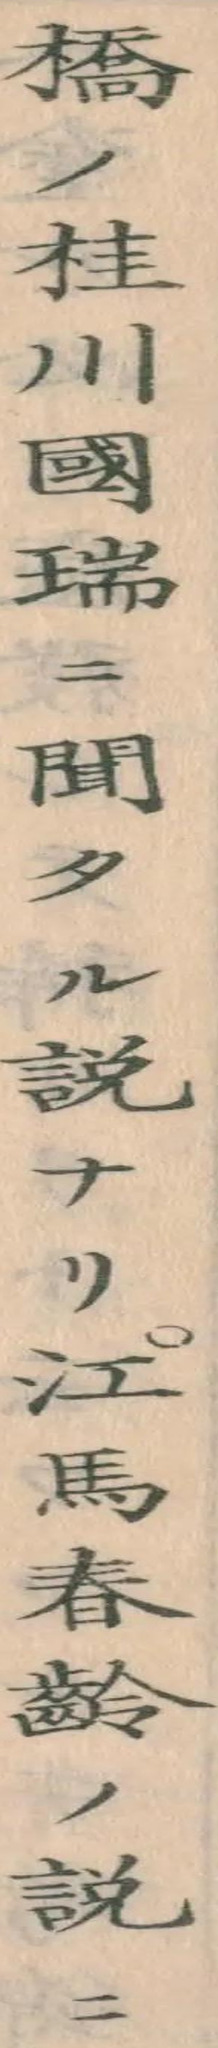橋ノ桂川国瑞ニ聞タル説ナリ。江馬春齢ノ説ニ
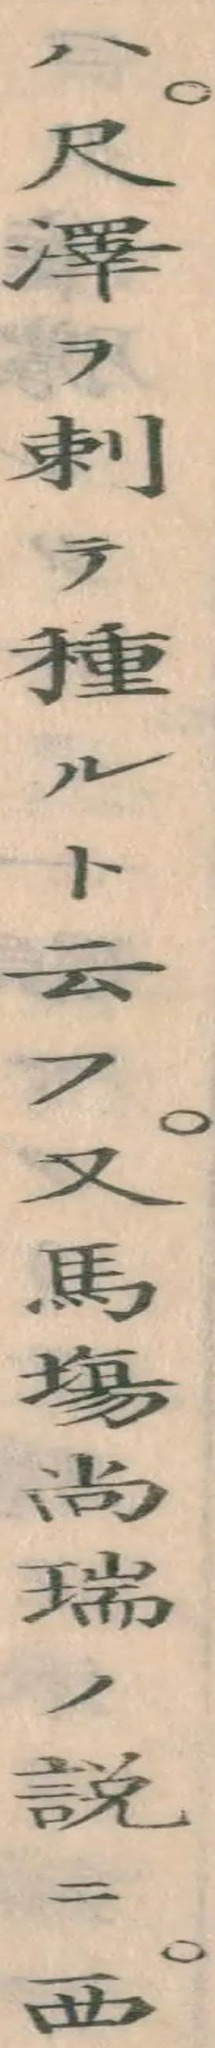ハ。尺沢ヲ刺テ種ルト云フ。又馬場尚瑞ノ説ニ。西
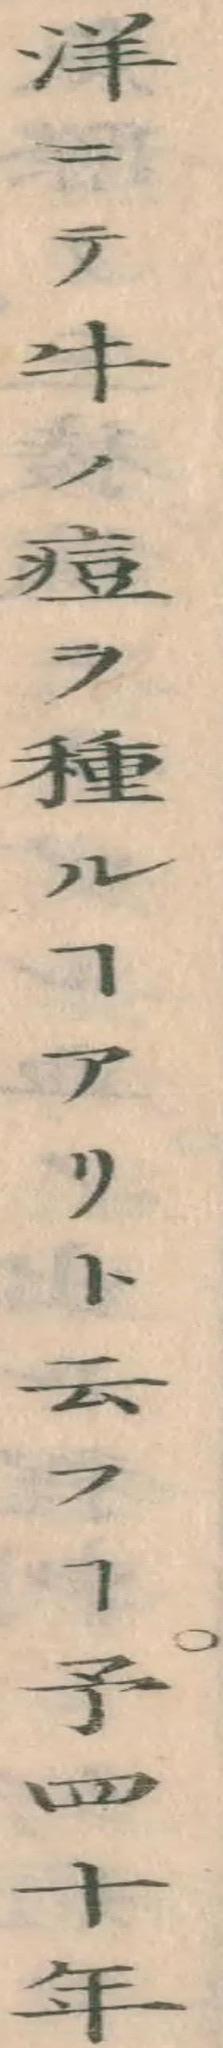洋ニテ牛ノ痘ヲ種ルヿアリト云フヿ。予四十年
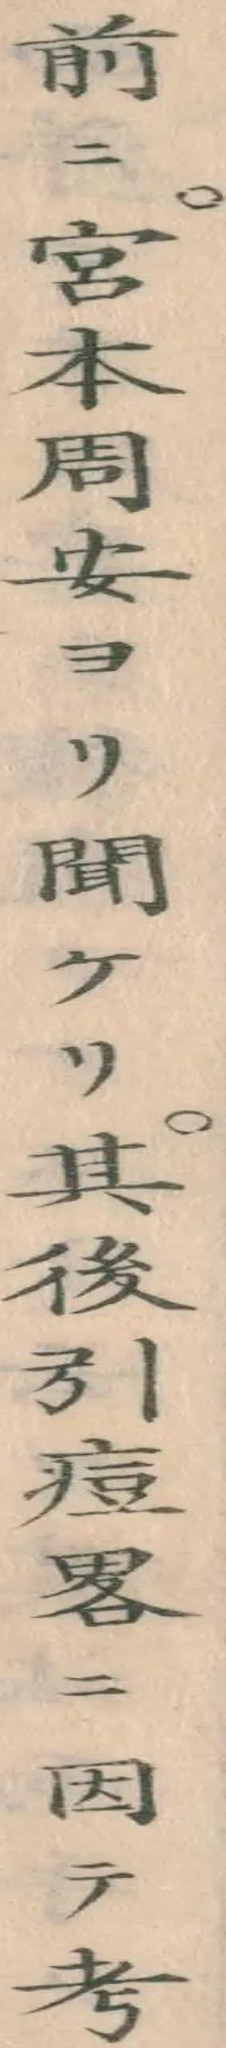前ニ。宮本周安ヨリ聞ケリ。其後引痘略ニ因テ考
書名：種痘弁義
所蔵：国立国会図書館 National Diet Library, JAPAN
